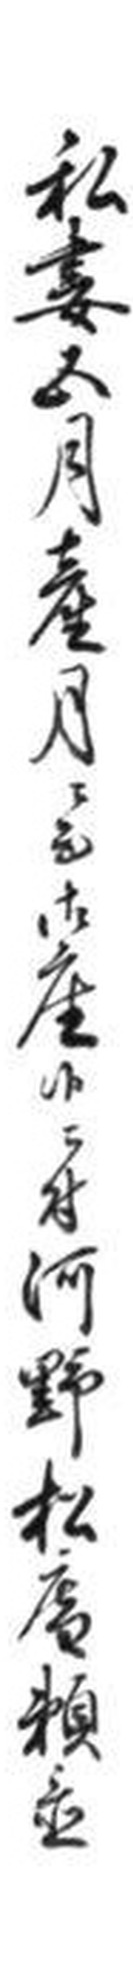私妻五月産月ニ而御座候ニ付河野松庵頼置
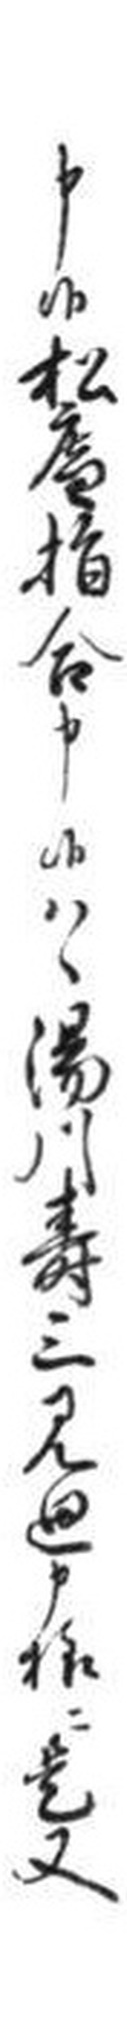申候松庵指合申候ハヽ湯川寿三見廻申様ニ是又
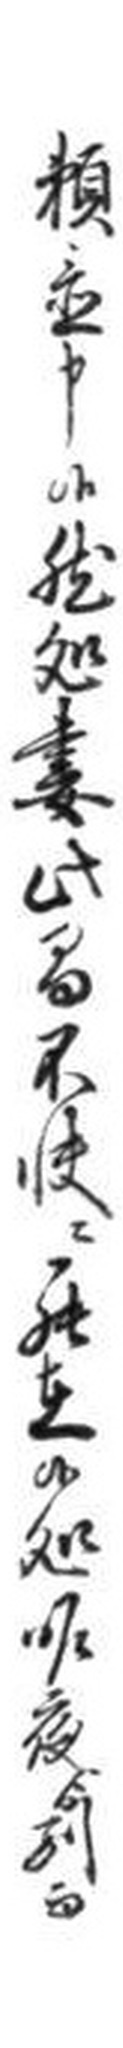頼置申候然処妻此間不快ニ罷在候処昨夜ゟ別而
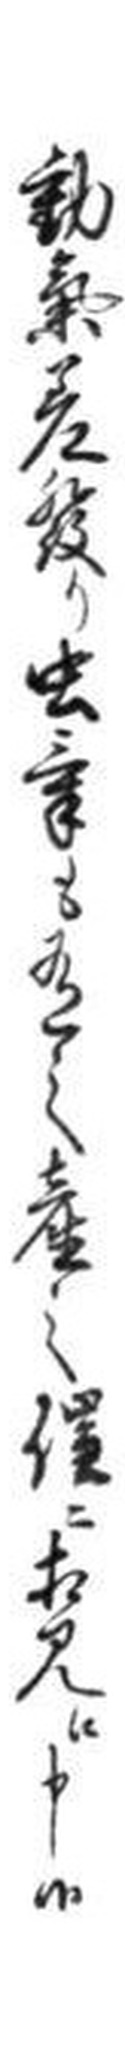動気差発り虫気も有之産之侯ニ相見江申候
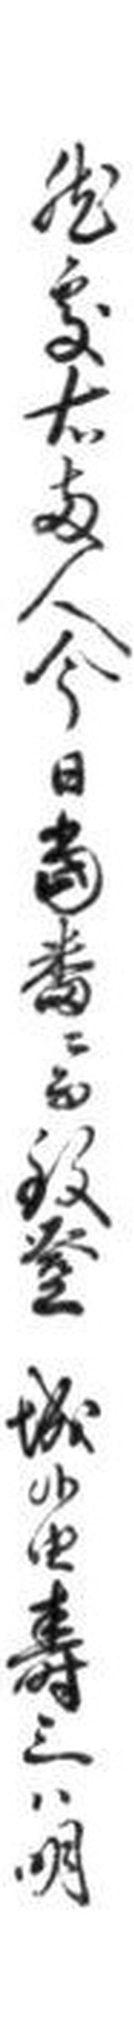然処右両人今日当番ニ而致登城候由寿三ハ明
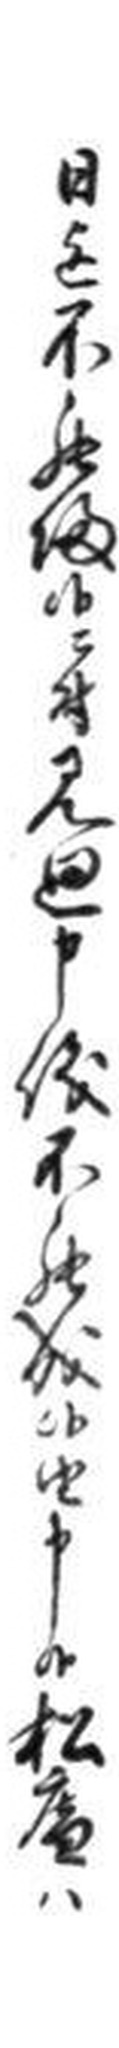日迄不罷帰候ニ付見廻申儀不罷成候由申候松庵ハ
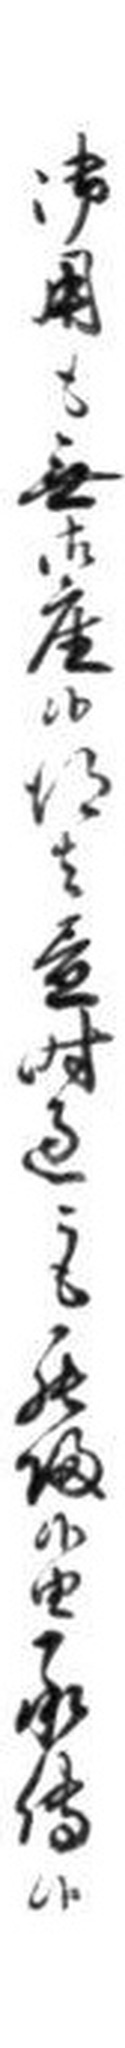御用も無御座候得者昼時過ニも罷帰候由承伝候
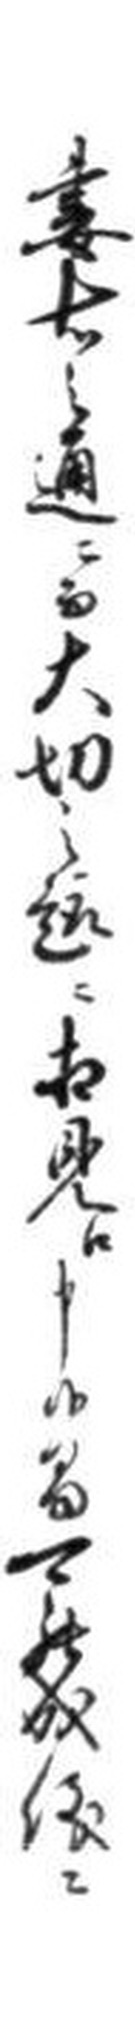妻右之通ニ而大切之趣ニ相見江申候間可罷成儀ニ
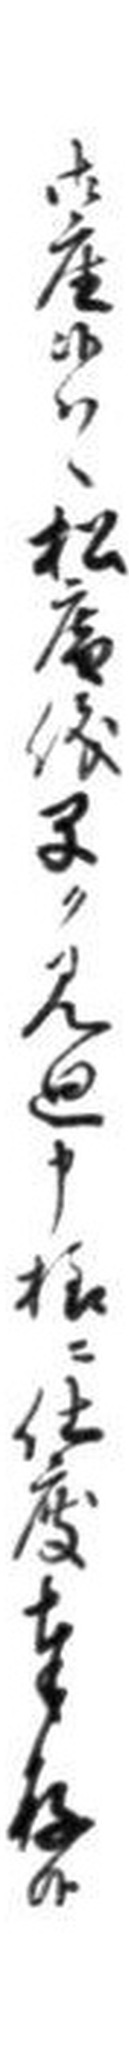御座候ハヽ松庵儀早ク見廻申様ニ仕度奉存候
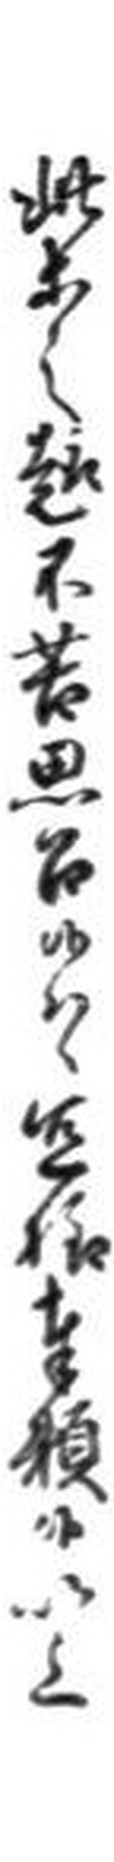此等之趣不苦思召候ハヽ宜様奉頼候以上
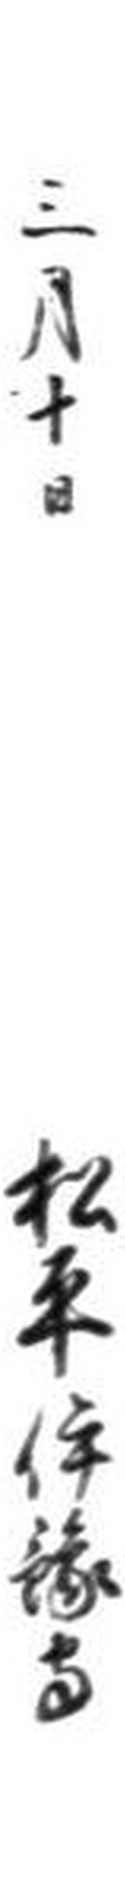三月十日松平伊予守
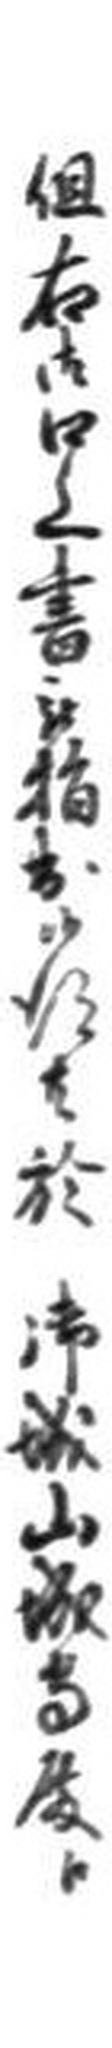但右御口上書被指出候得共於御城山城守殿江
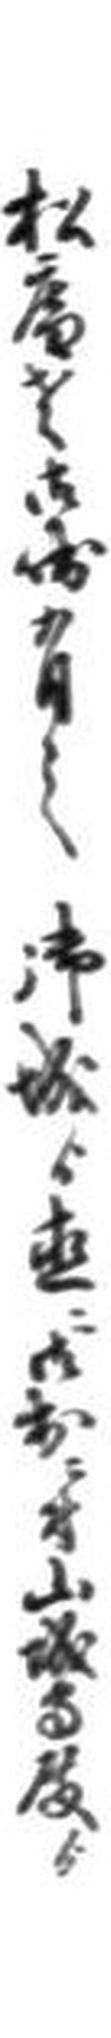松庵老御咄有之御城ゟ直ニ御出ニ付山城守殿ゟ
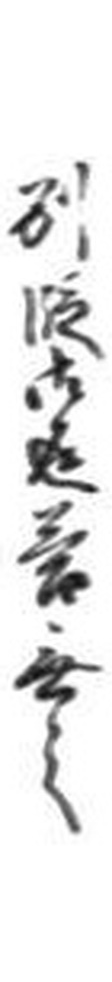別段御返答無之
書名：家譜 三十三 吉邦公 享保四年
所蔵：福井県文書館 Fukui Prefectural Archives
